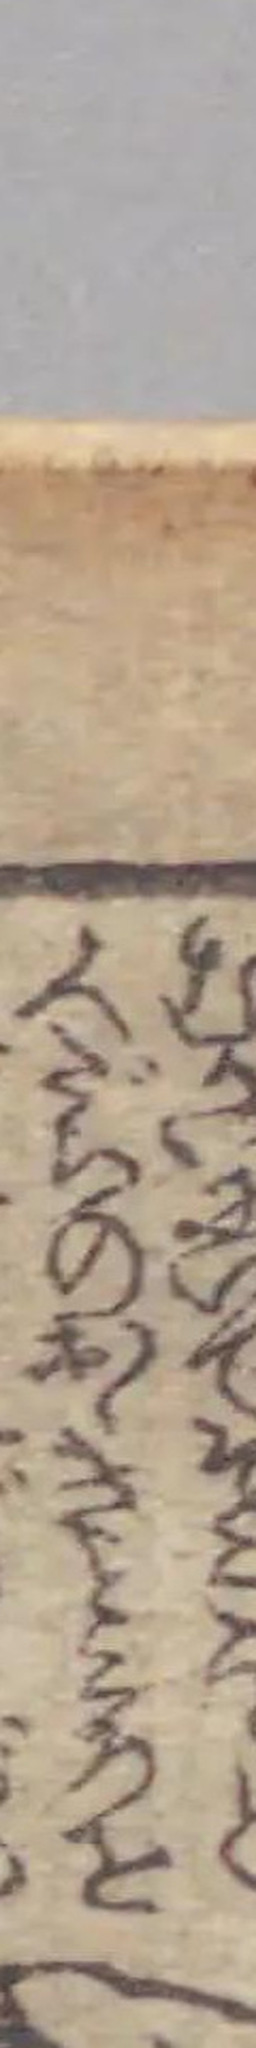人だちのおゝきところを
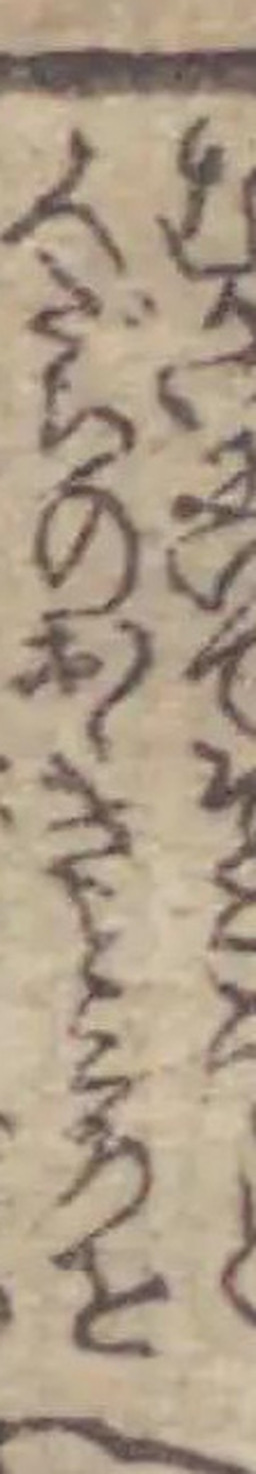人だちのおゝきところを
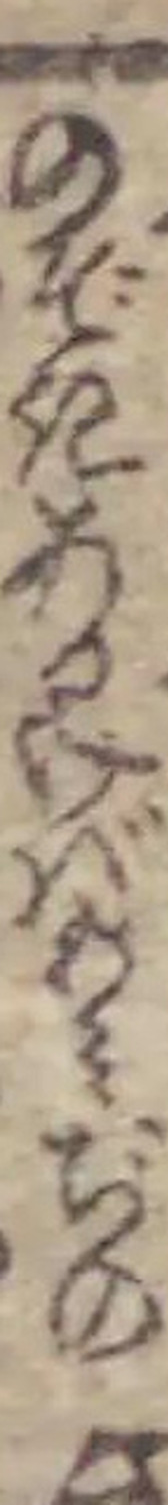のぞきあるけばもみぢの
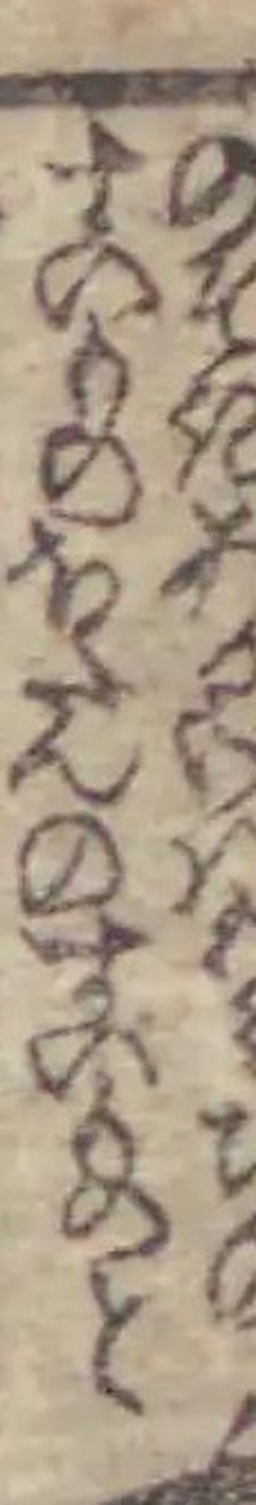すいものほたんのすいものと
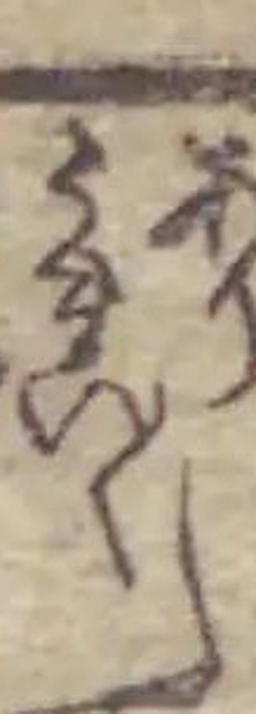うまい〳〵
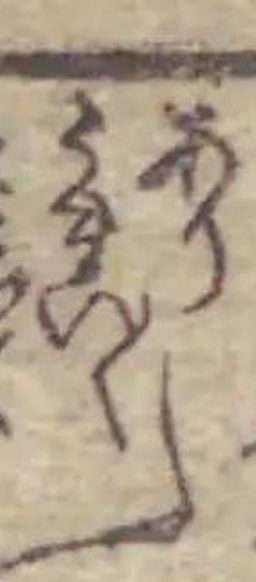うまい〳〵
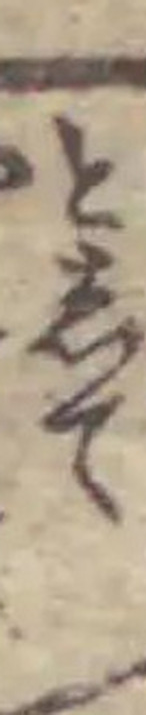として
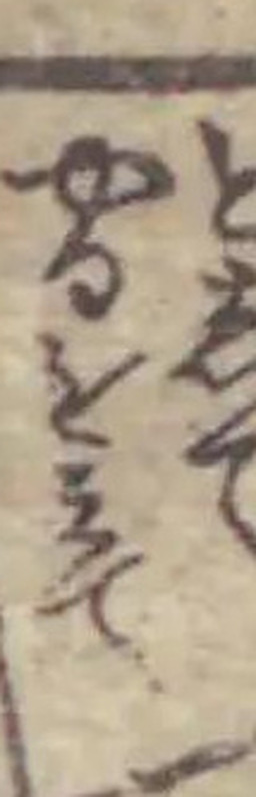やるをみて
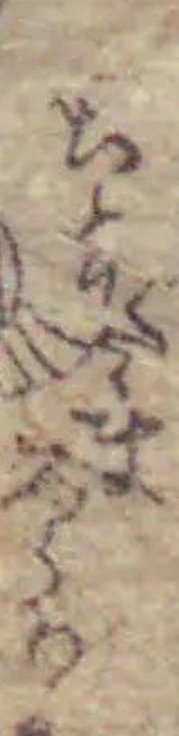ちとあたゝま
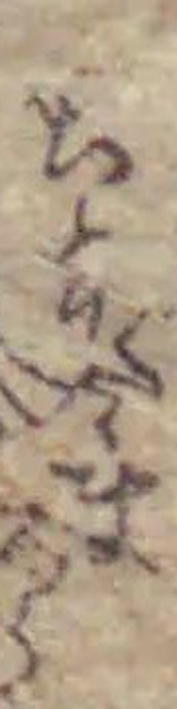ちとあたゝま
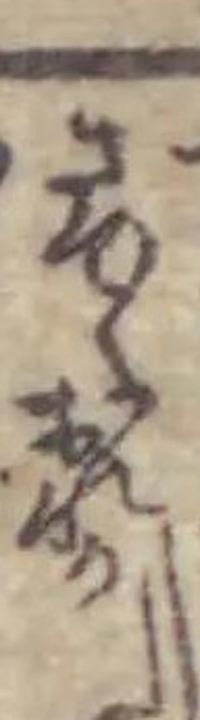さて〳〵おれか
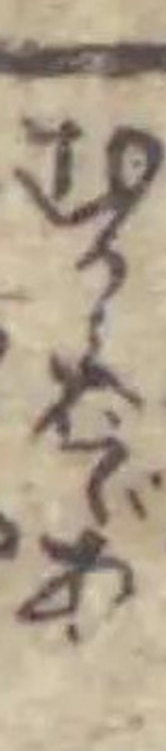むかしばゞあ
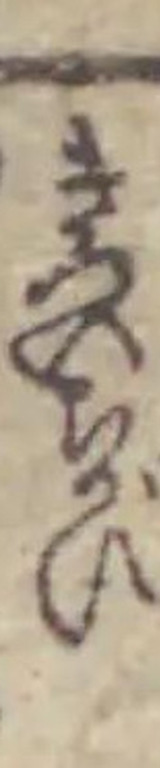きついちがひ
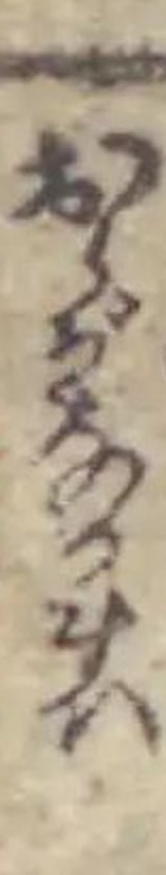おらがなかまは
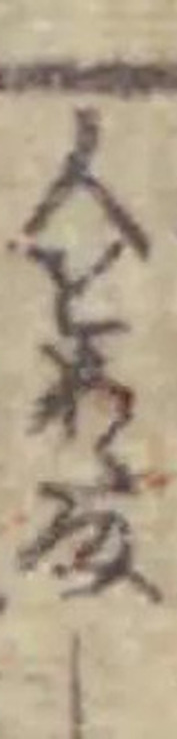人をあたま
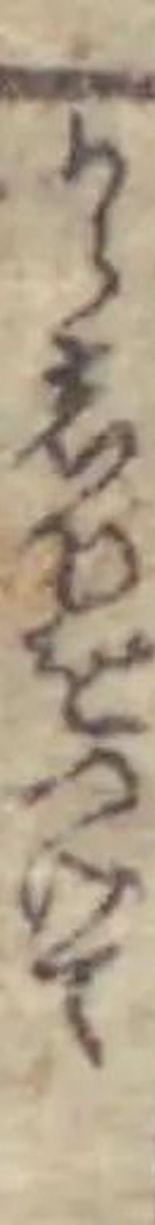からしほをつけて
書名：化物昼寝鼾 2巻
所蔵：国立国会図書館 National Diet Library, JAPAN
